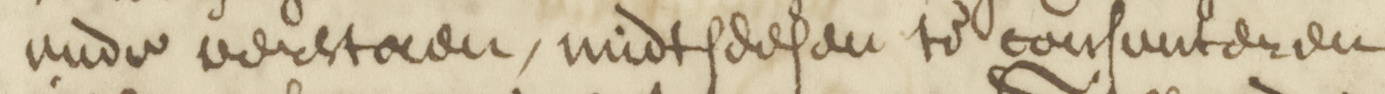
ende verstaen, midtsdesen te consenteren
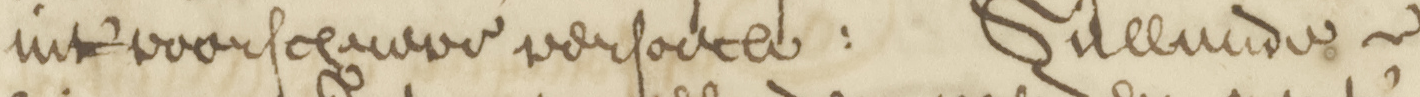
int' voorschreve versoeck: Sullende -
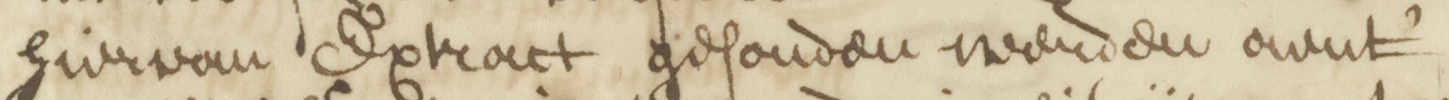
hiervan Extract gesonden werden aent‛
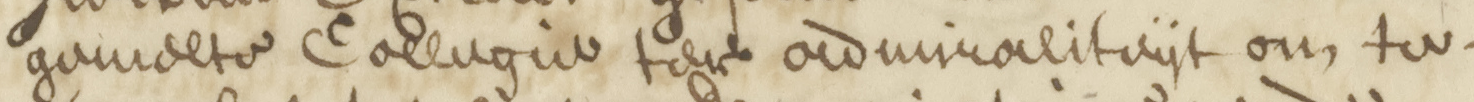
gemelte Collegie ter admiraliteijt om te —
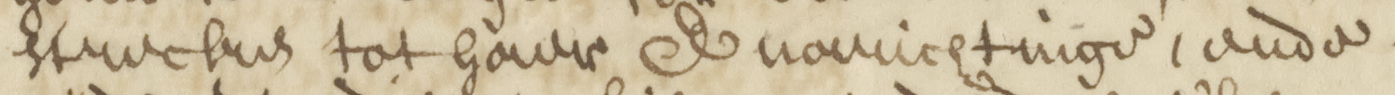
strecken tot haer E narichtinge, ende —
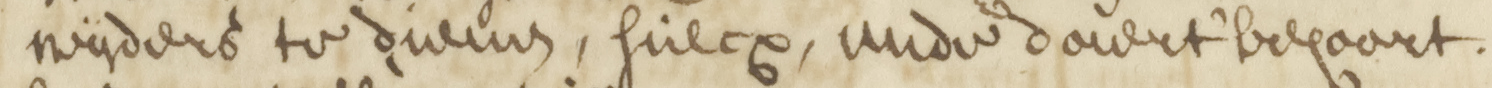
wijders te dienen, sulcx, ende daert' behoort.
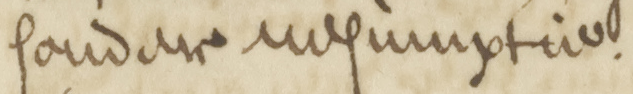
sonder resumptie.
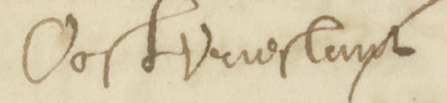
OostVrieslant
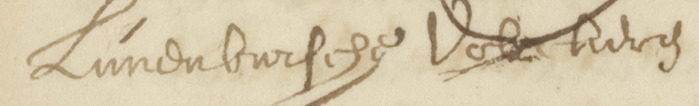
Lunenbursche Volckeren
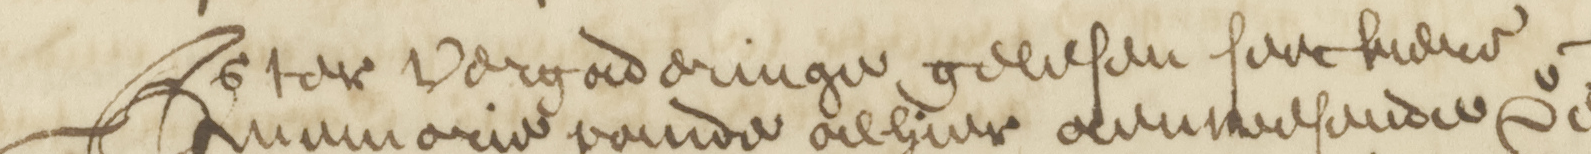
Is ter Vergaderinge gelesen seeckere —
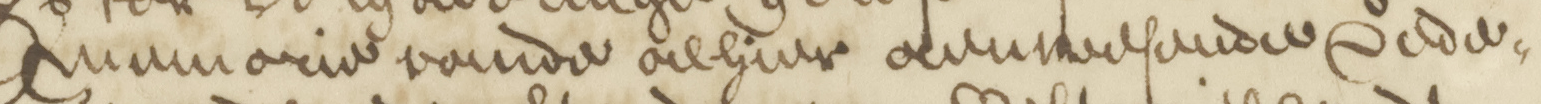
memorie vande alhier aenwesende Gede,,
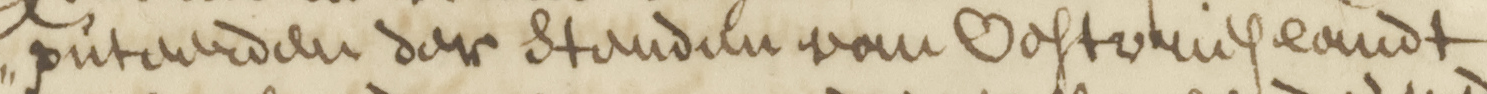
„puteerden der stenden van Oostvrieslandt
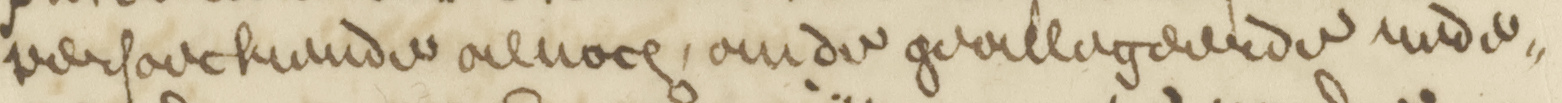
versoeckende alnoch, om de geallegeerde rede,,
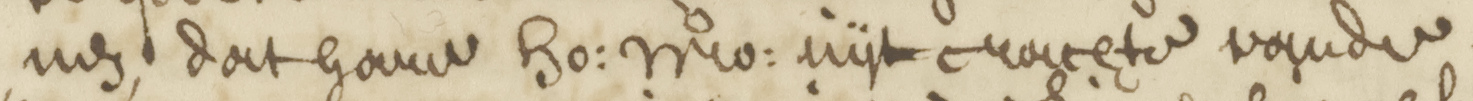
„nen, dat hare Ho:Mo: uijt crachte vande —
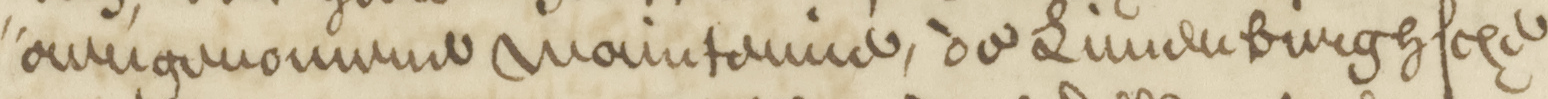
aengenomene Maintenue, de Lunenburghsche
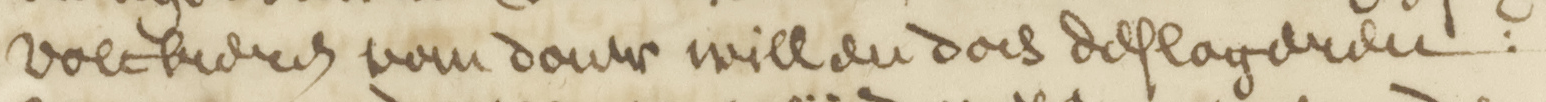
volckeren van daer willen doen deslogeren:
